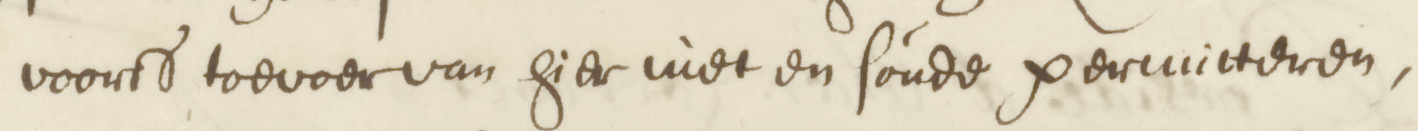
voors toevoer van hier niet en soude permitteren,
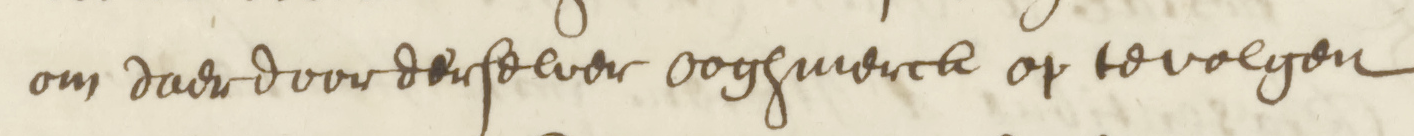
om daer door derselver ooghmerck op te volgen
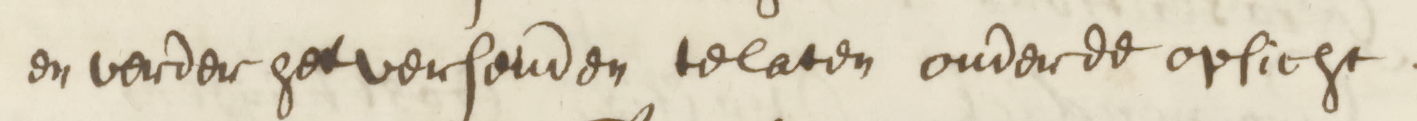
en verder het versenden te laten onder de opsicht
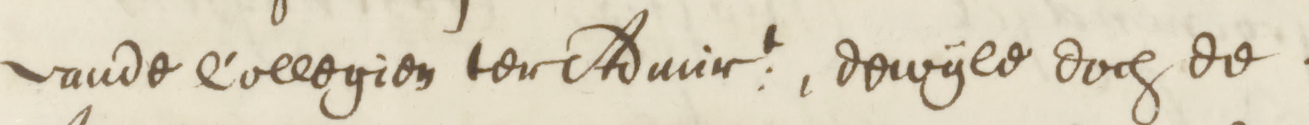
vande Collegien ter Admirt:,dewijle doch de
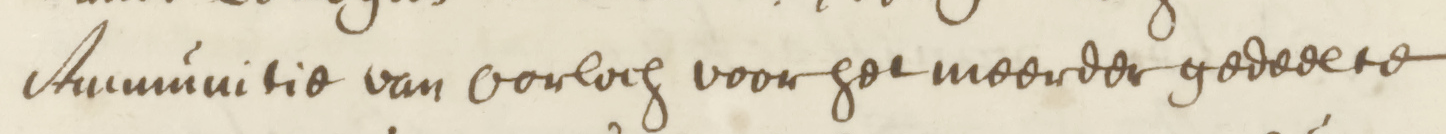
Ammunitie van Oorloch voor het meerder gedeelte
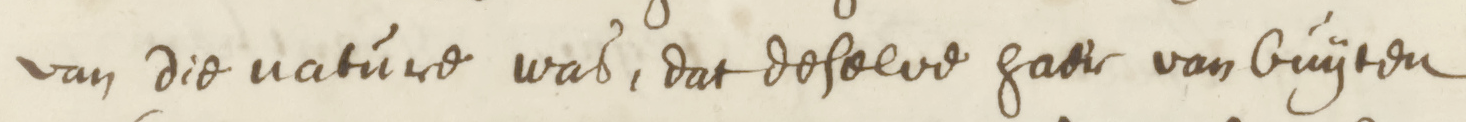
van die nature was, dat deselve haer van buijten
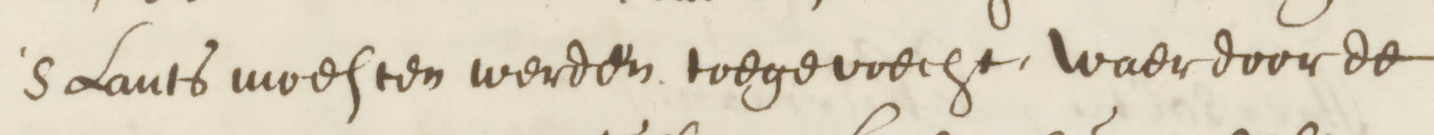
‛s Lants moesten werden toegevoecht, waerdoor de
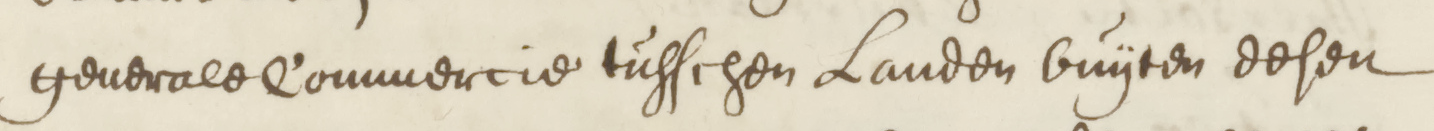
generale Commercie tusschen Landen buijten desen
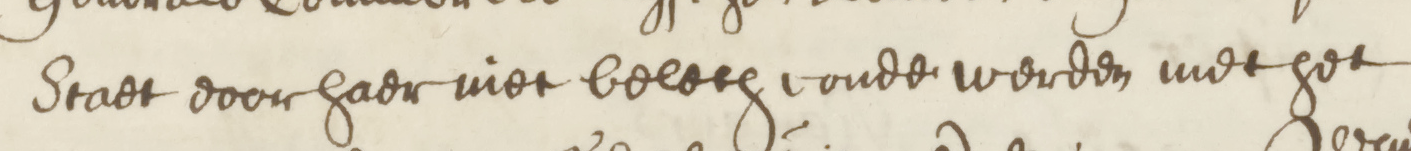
Stadt door haer niet beleth conde werden met het
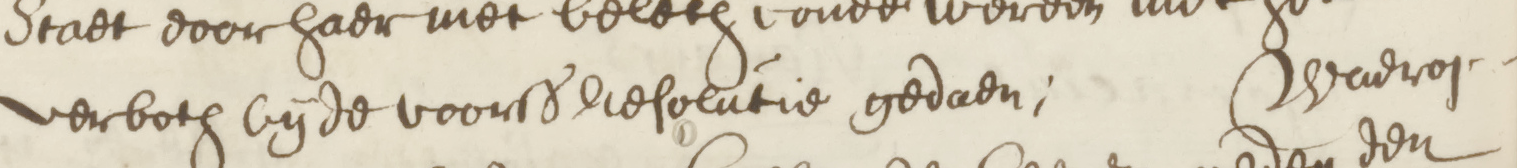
verboth bijde voors resolutie gedaen: Waerop
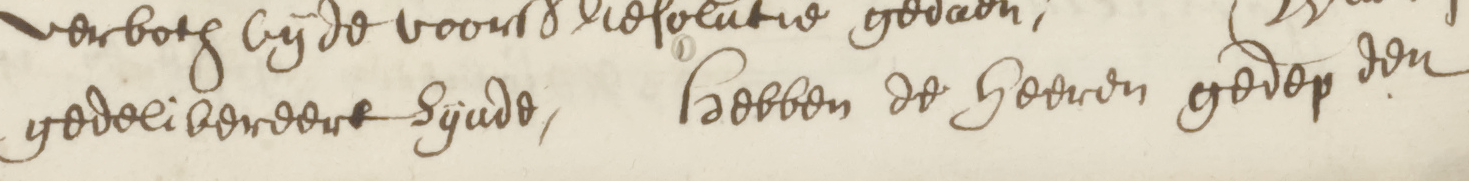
gedelibereert sijnde, hebben de heeren gedepden.
